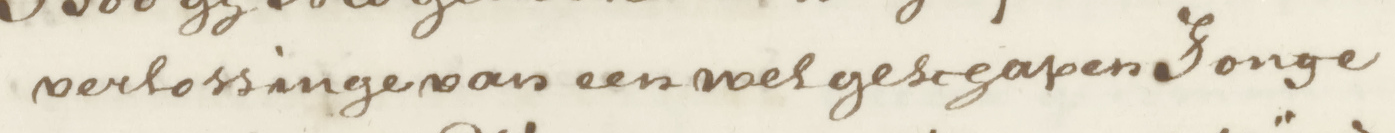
verlossinge van een welgeschapen Jonge
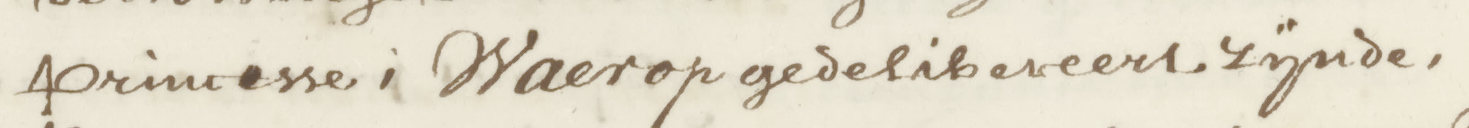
Princesse; Waerop gedelibereert zijnde,
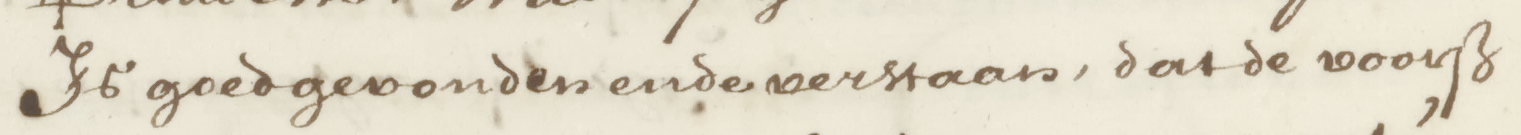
Is goedgevonden ende verstaan, dat de voors
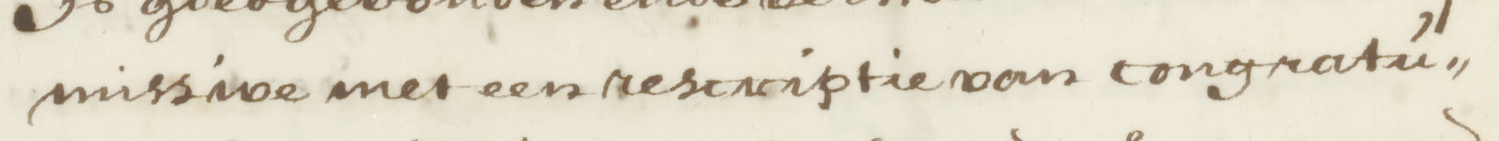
missive met een rescriptie van congratu„
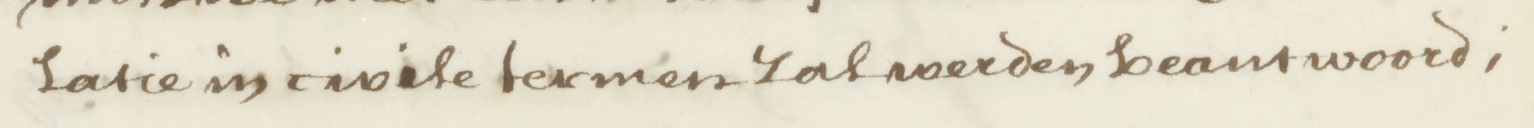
latie in civile termen zal werden beantwoord.
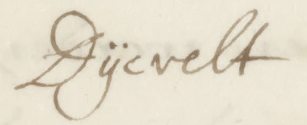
Dijcvelt
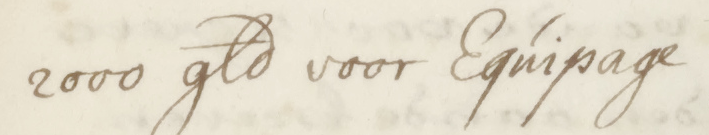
2000 gld voor Equipage
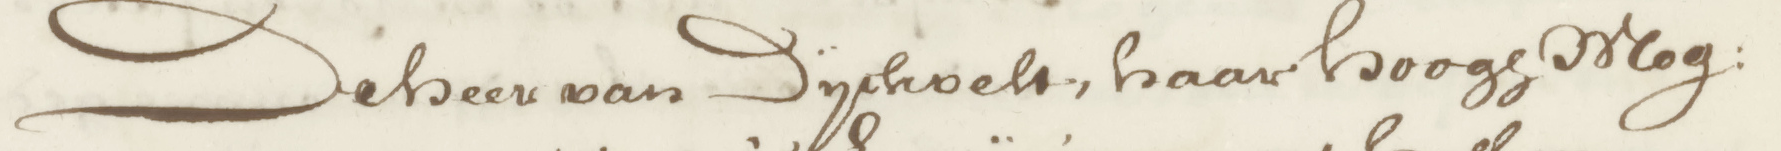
De heer van Dijckvelt, haar Hoogh Mog:
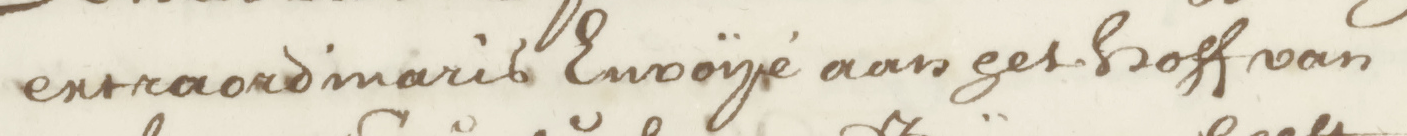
extraordinaris Envoije aan het Hoff van
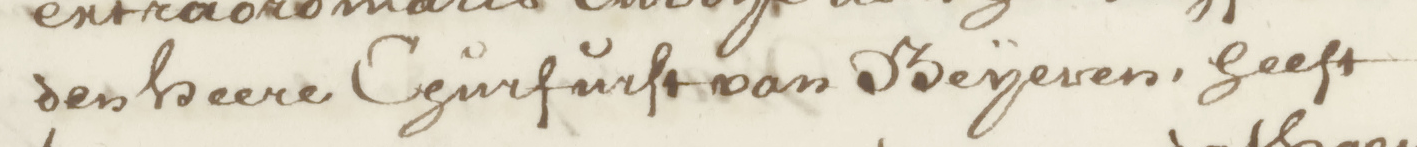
den heere Churfurst van Beijeren, heeft
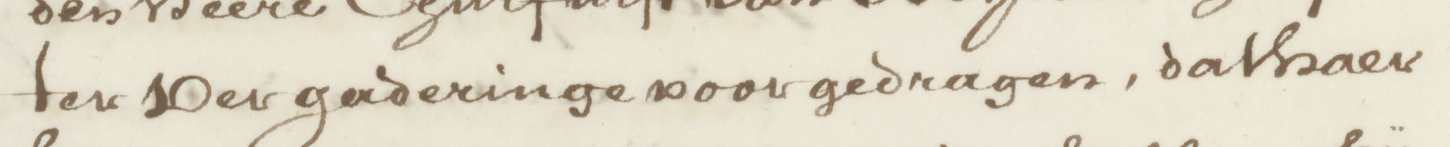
ter vergaderinge voorgedragen, dat haer
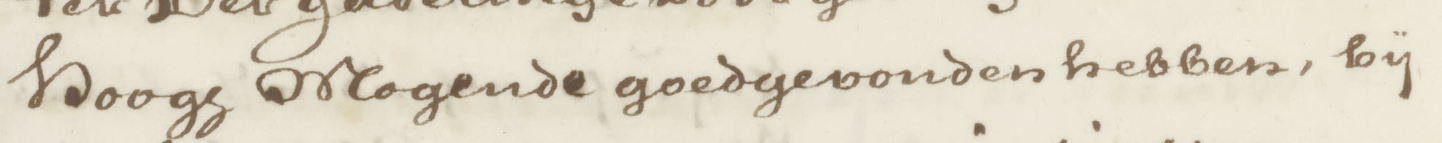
Hoogh Mogende goedgevonden hebben, bij
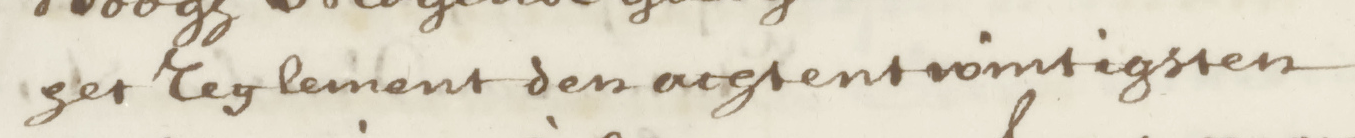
het reglement den achtentwintigsten
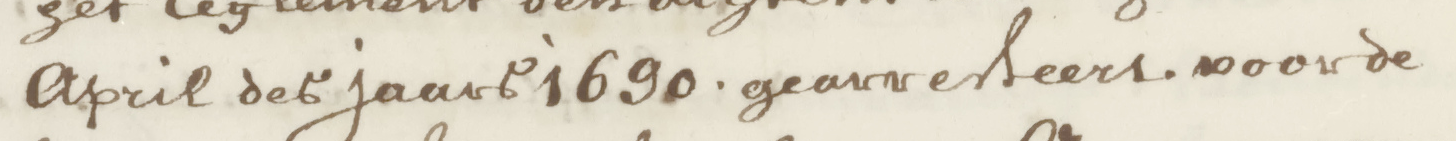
April des jaars 1690 gearresteert voor de
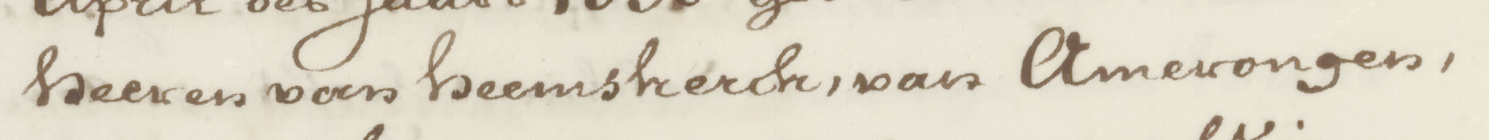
heeren van heemskerck, van Amerongen,
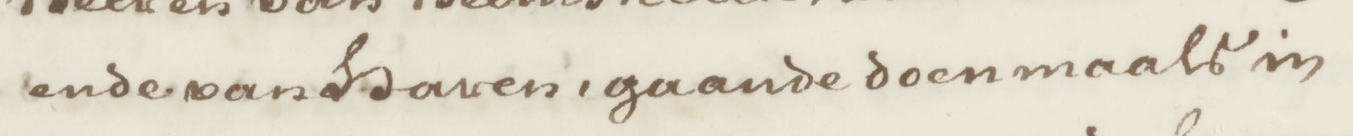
ende van Haren, gaande doen maals in
